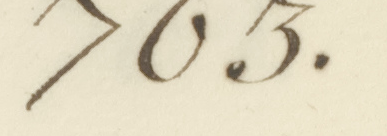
763.
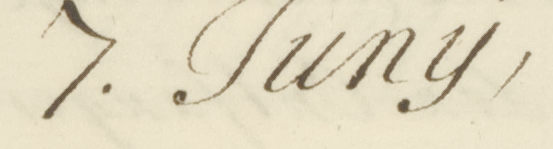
7. Junij,
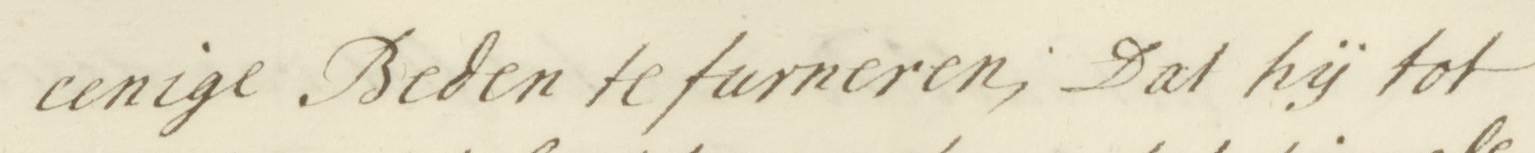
eenige Beden te furneren; Dat hij tot
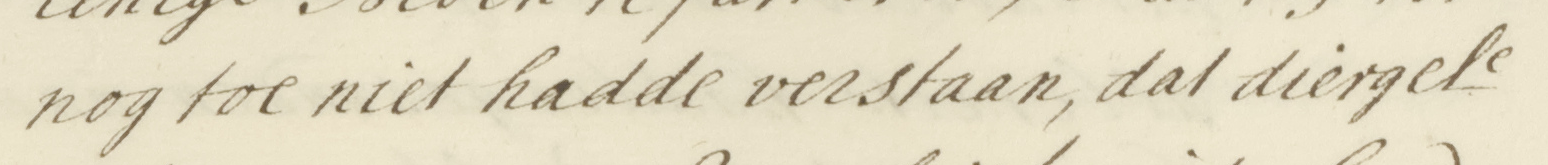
nog toe niet hadde verstaan, dat diergele
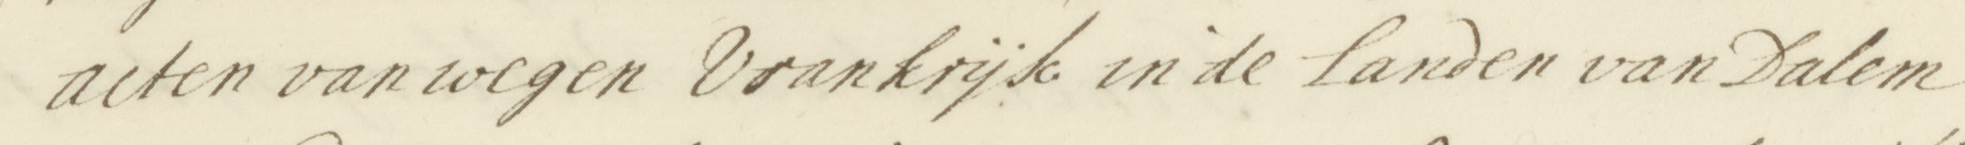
acten van wegen Vrankrijk in de landen van Dalem
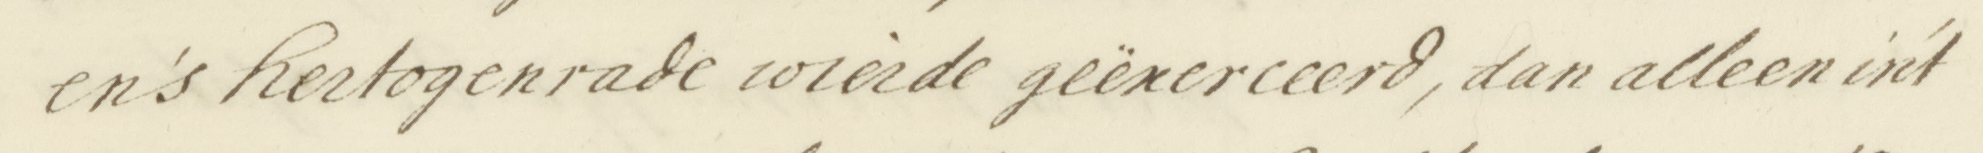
en's hertogenrade wierde geëxerceerd, dan alleen in't
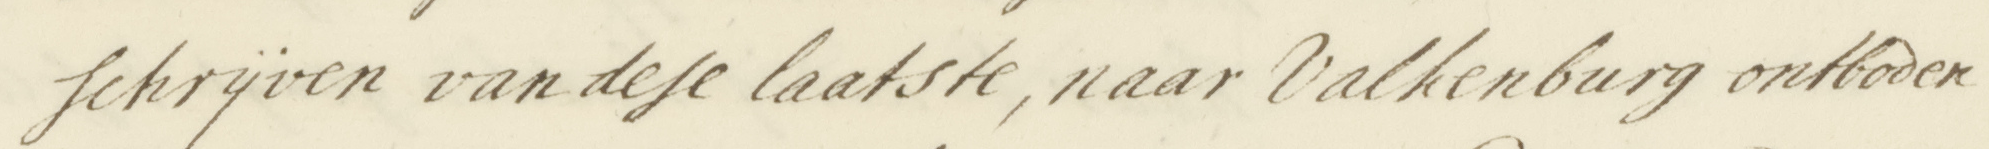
schrijven van dese laatste, naar Valkenburg ontboden
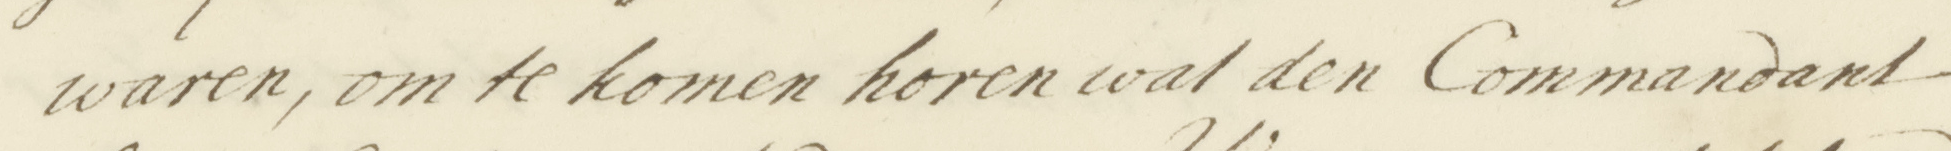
waren, om te komen horen wat den Commandant
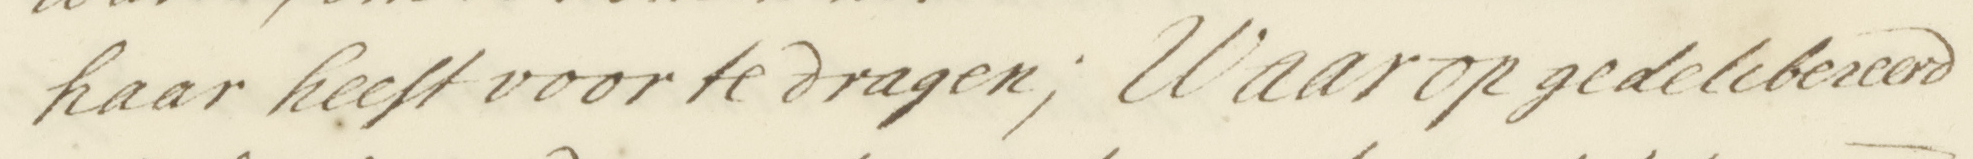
haar heeft voor te dragen; Waarop gedelibereerd
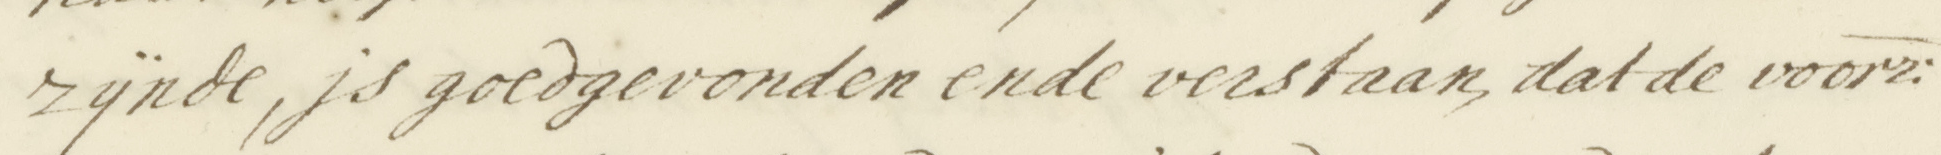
zijnde, is goedgevonden ende verstaan, dat de voorz:
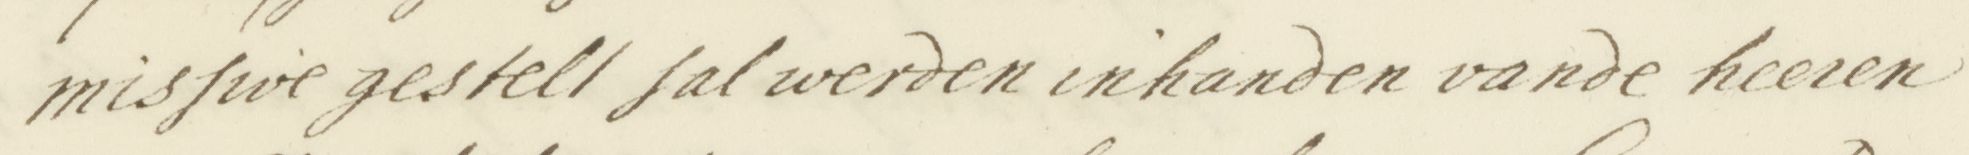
missive gestelt sal werden in handen vande heeren
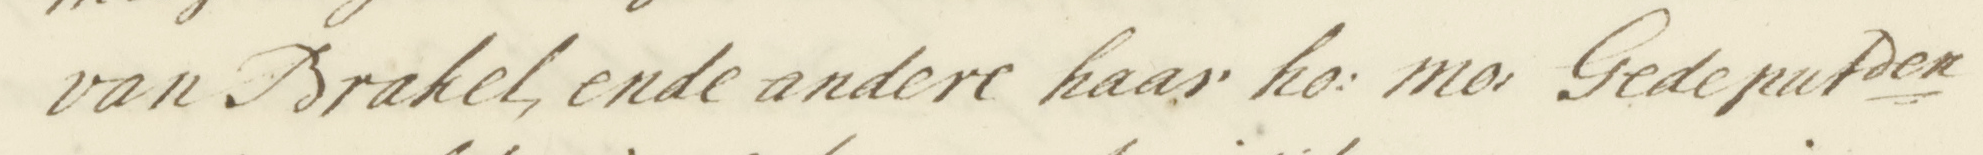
van Brakel, ende andere haar ho:mo: Gedeputden
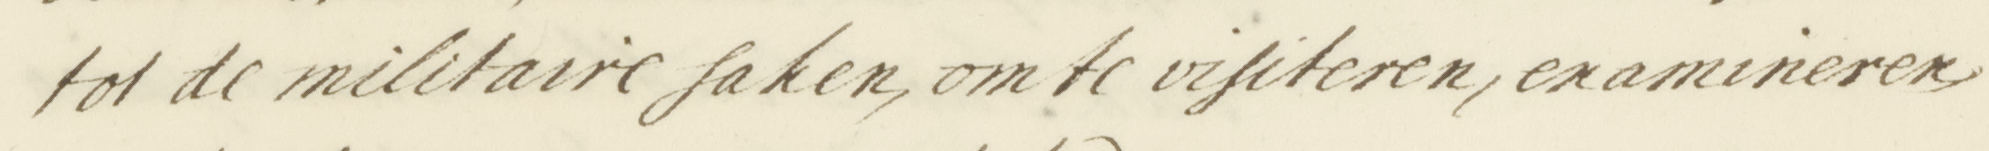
tot de militaire saken, om te visiteren, examineren,
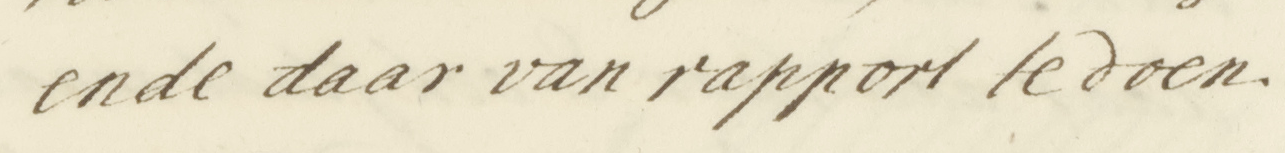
ende daar van rapport te doen.
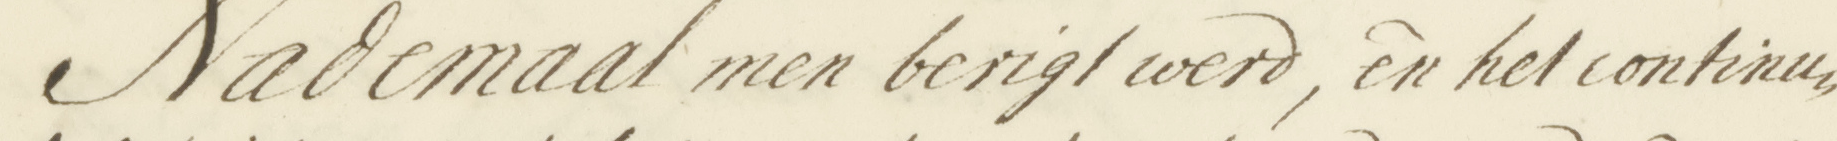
Nademaal men berigt werd, en het continu„
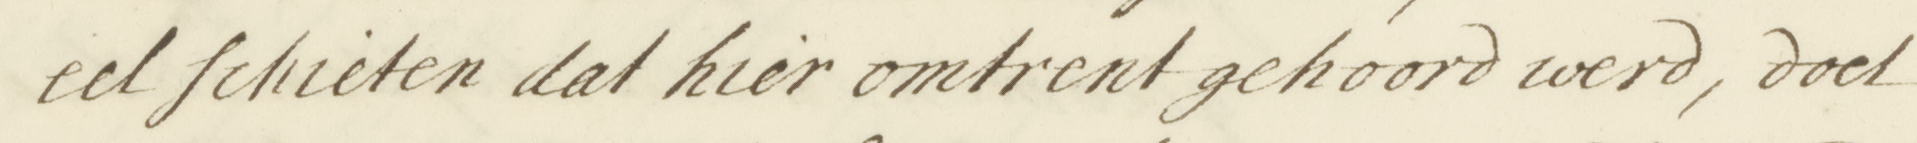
eel schieten dat hier omtrent gehoord werd, doet
